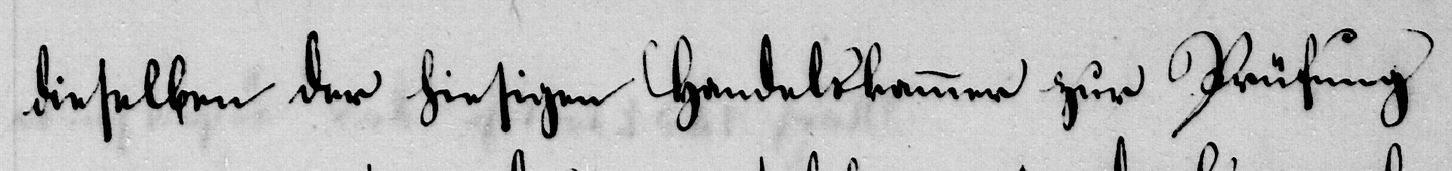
dieselben der hiesigen Handelskammer zur Prüfung
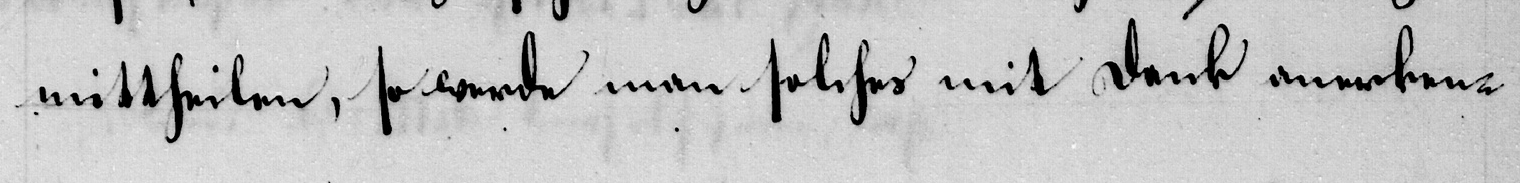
mittheilen, so werde man solches mit Dank anerken¬
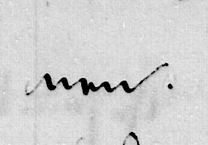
nen.
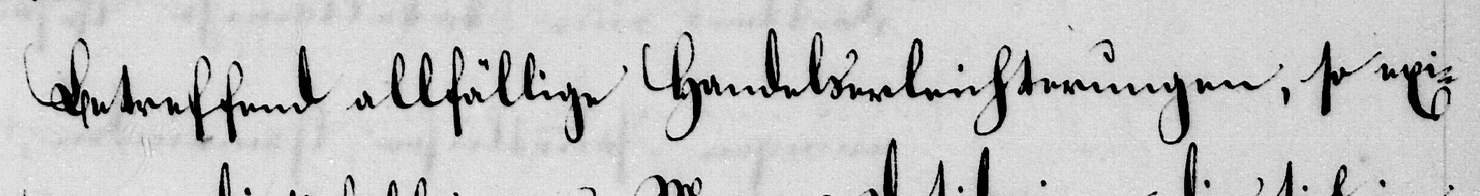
Betreffend allfällige Handelserleichterungen, so exi¬
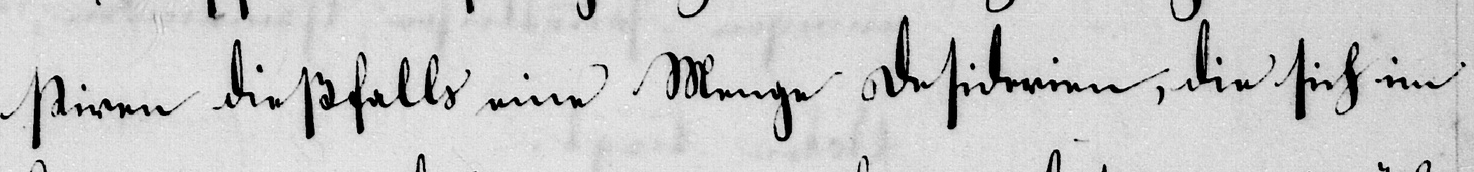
stiren dießfalls eine Menge Desiderien, die sich im
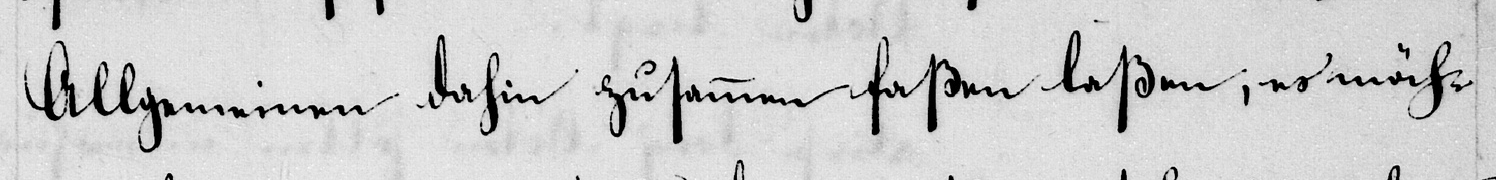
Allgemeinen dahin zusammen faßen laßen, es möch¬
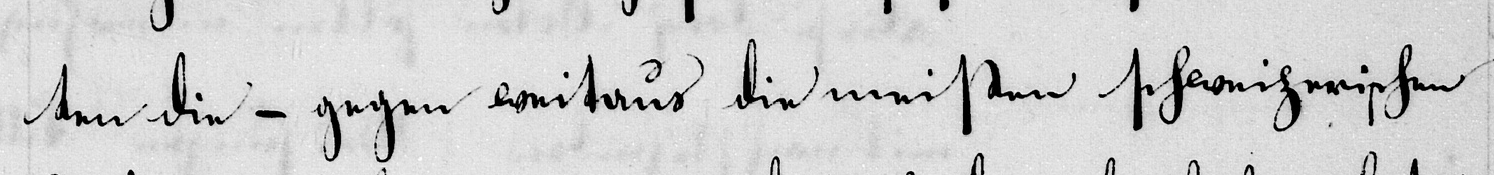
ten die – gegen weitaus die meisten schweizerischen
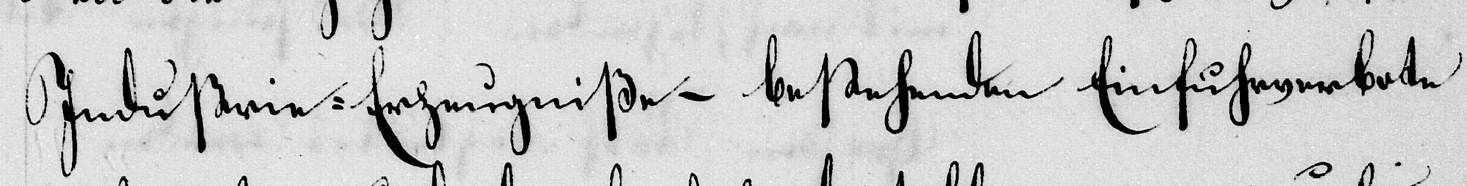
Industrie-Erzeugniße – bestehenden Einfuhrverbote
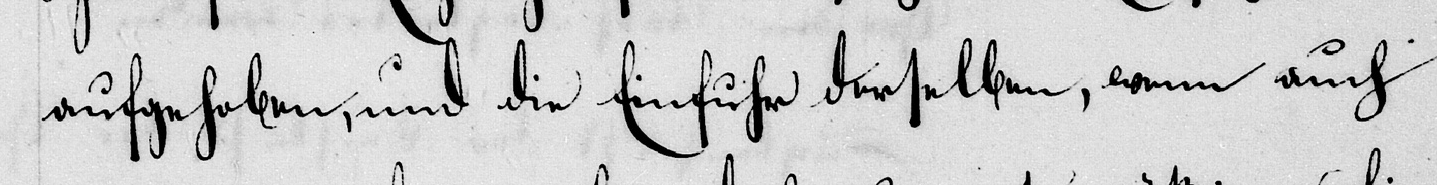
aufgehoben, und die Einfuhr derselben, wenn auch
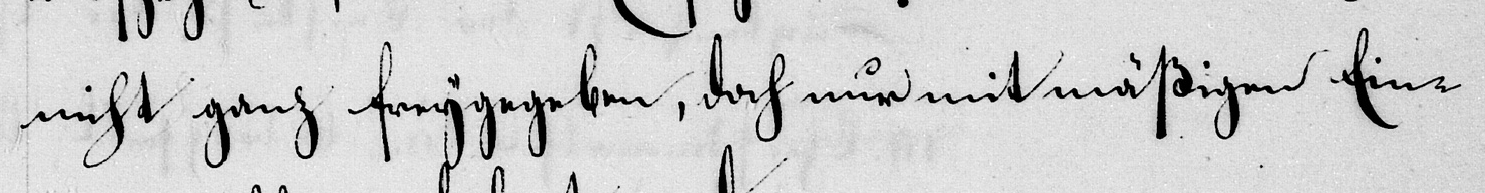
nicht ganz freygegeben, doch nur mit mäßigen Ein¬
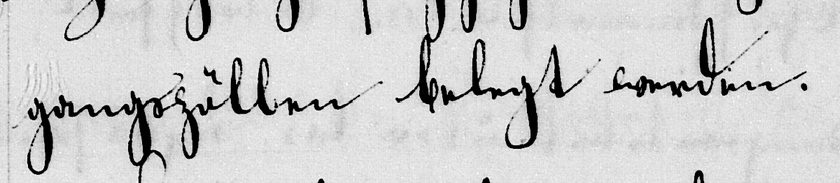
gangszöllen belegt werden.
